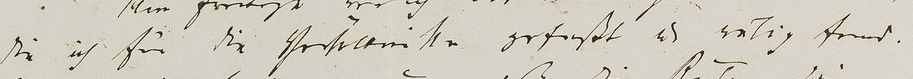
die ich für die Verhältnisse gefaßt u. ruhig fand.
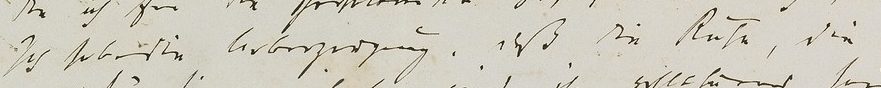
Ich habe die Ueberzeugung, daß die Ruhe, die
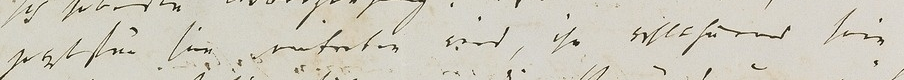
jetzt für sie eintreten wird, ihr wohlthuend sein
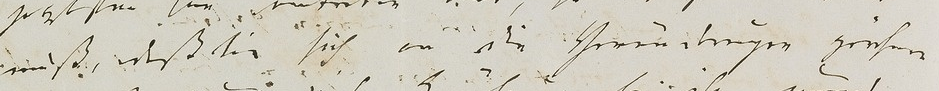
muß, daß sie sich an die Veränderungen gewöhnen
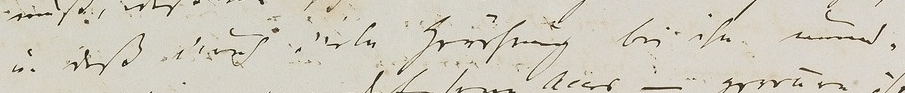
u. daß durch diese Gewöhnung bei ihr unend-
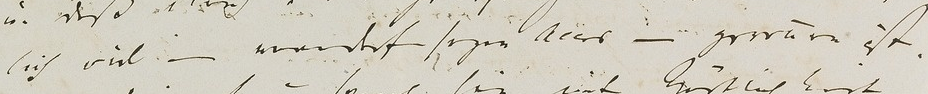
lich viel – man darf sagen Alles – gewonnen ist.
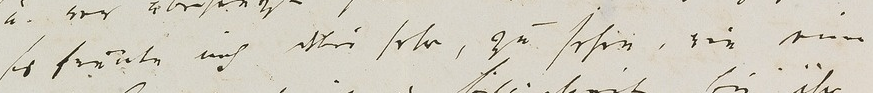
Es freute mich dabei sehr, zu sehen, wie eine
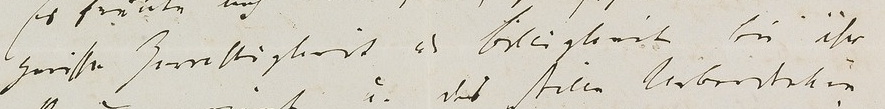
gewisse Gerechtigkeit u. Billigkeit bei ihr
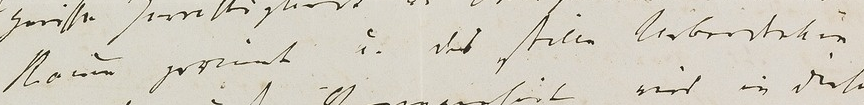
Raum gewinnt u. das «stille Ueberdenken»
